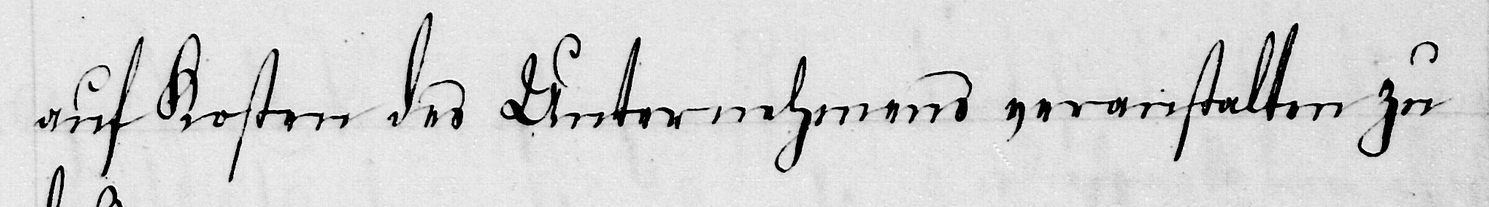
auf Kosten des Unternehmens veranstalten zu
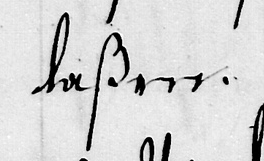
laßen.
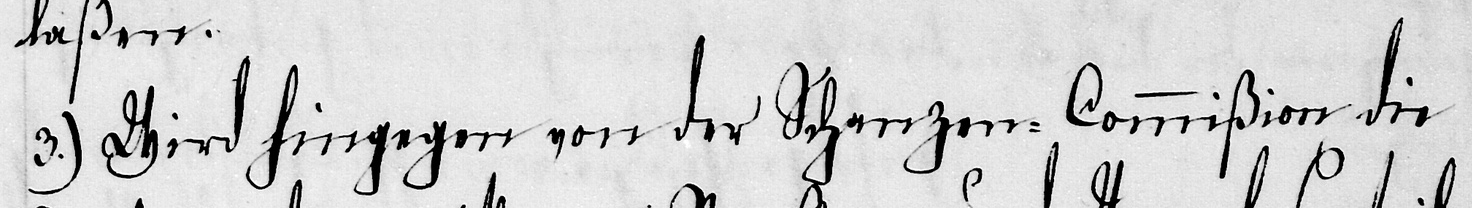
3.) Wird hingegen von der Schanzen-Commißion die
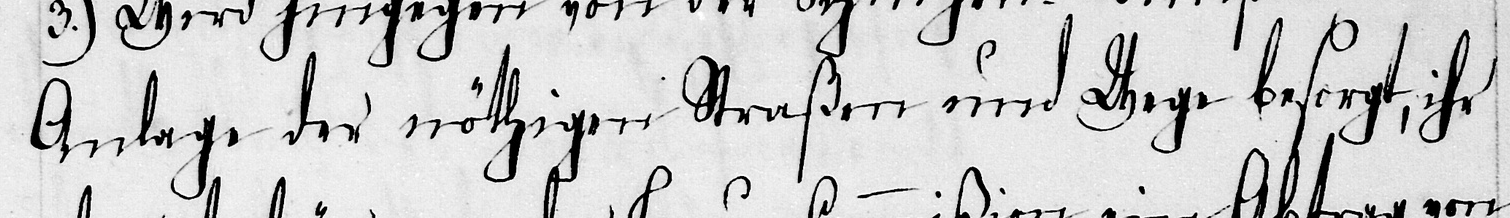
Anlage der nöthigen Straßen und Wege besorgt, ihr
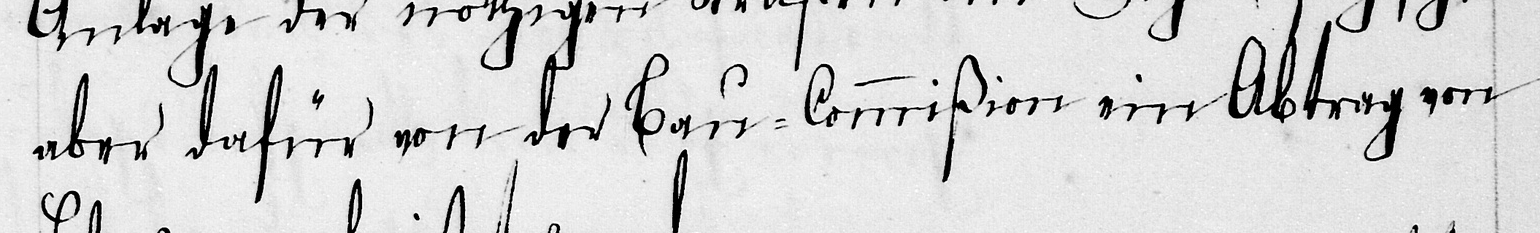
aber dafür von der Bau-Commißion ein Abtrag von
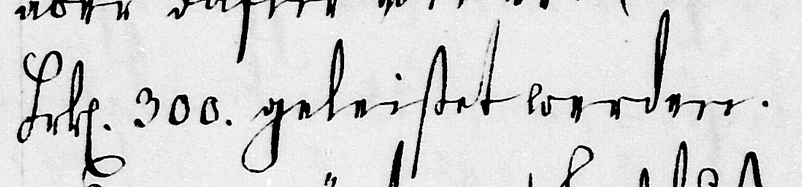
k[en]. 300. geleistet werden.
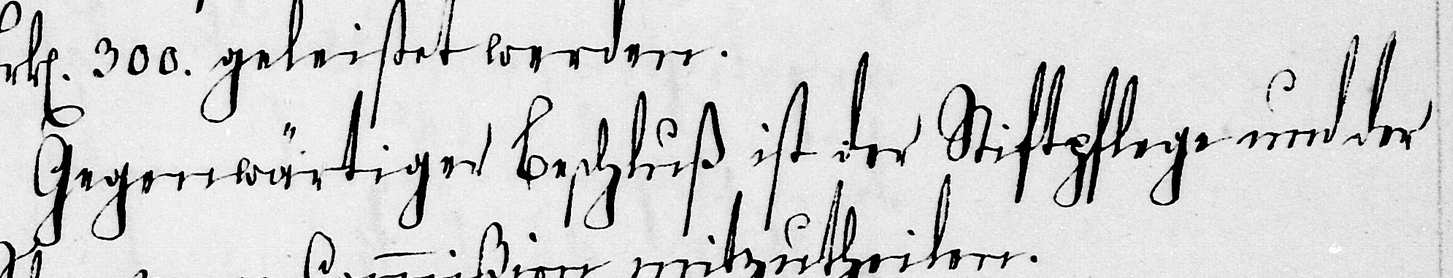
Gegenwärtiger Beschluß ist der Stiftpflege und der
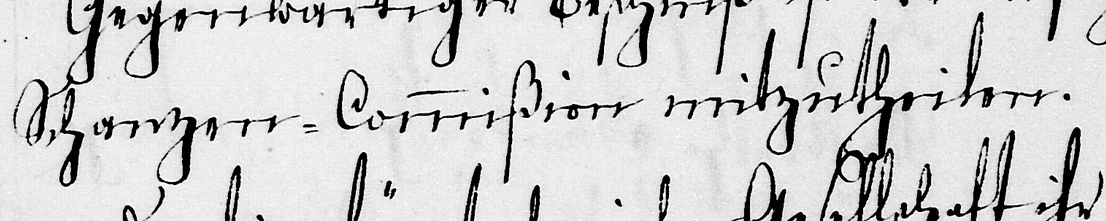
Schanzen-Commißion mitzutheilen.
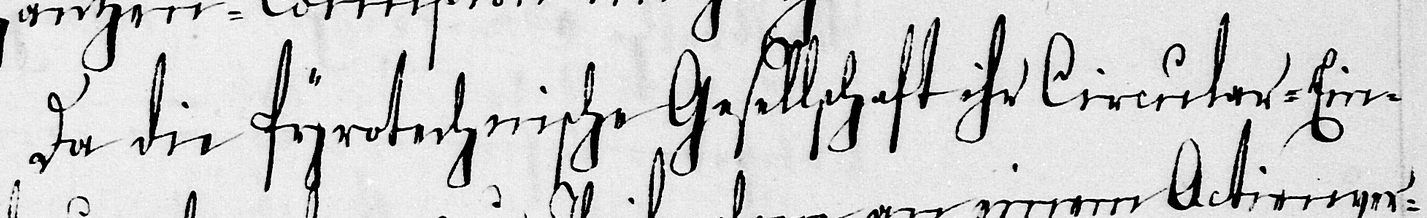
Da die Pyrotechnische Gesellschaft ihr Circ¬
